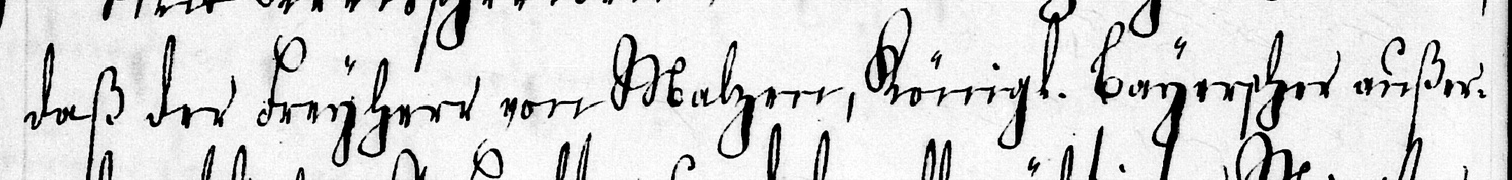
daß der Freyherr von Malzen, Königl. Bayerscher außer¬
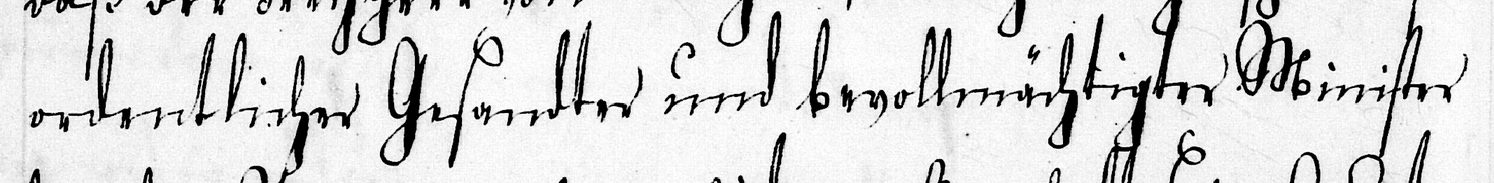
ordentlicher Gesandter und bevollmächtigter Minister
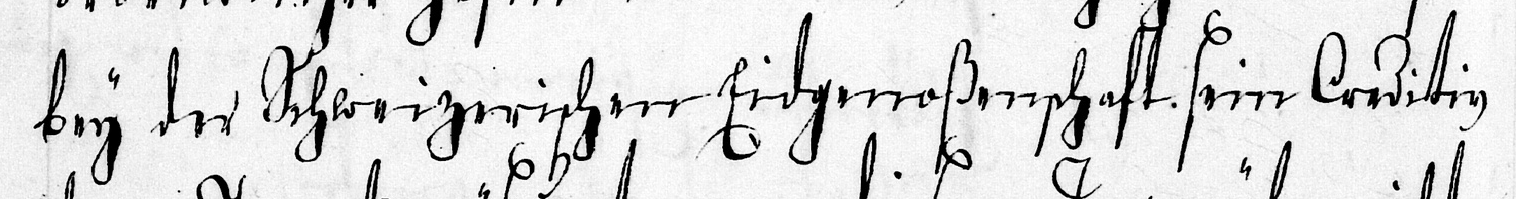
bey der Schweizerischen Eidgenoßenschaft sein Creditiv
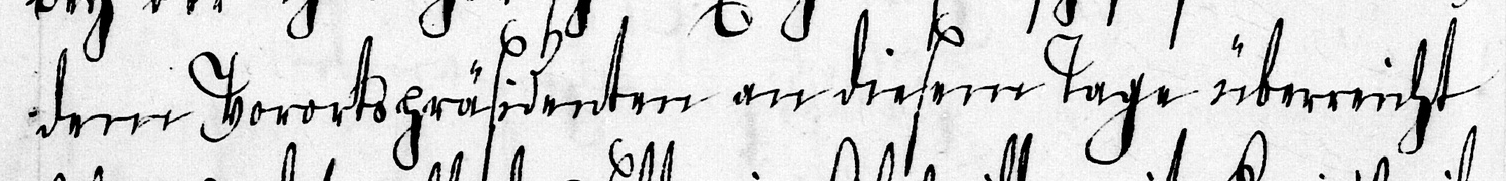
dem Vorortspräsidenten an diesem Tage überreicht
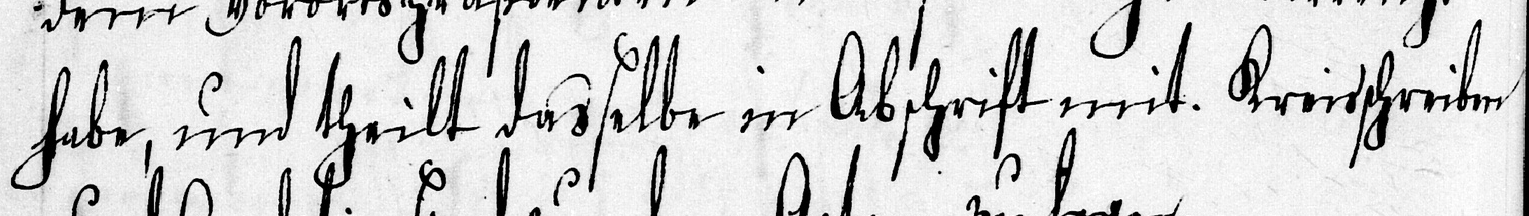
habe, und theilt dasselbe in Abschrift mit. Kreis¬
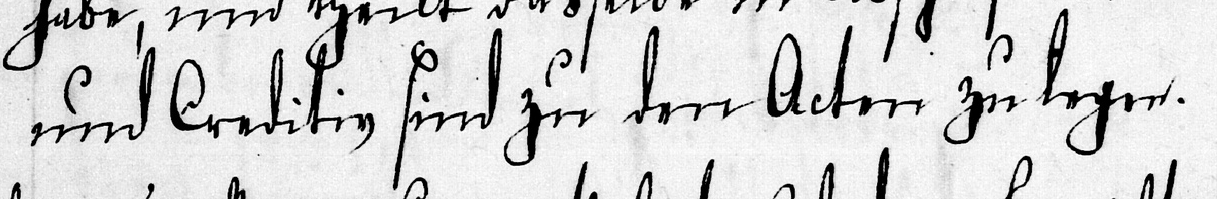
und Creditiv sind zu den Acten zu legen.
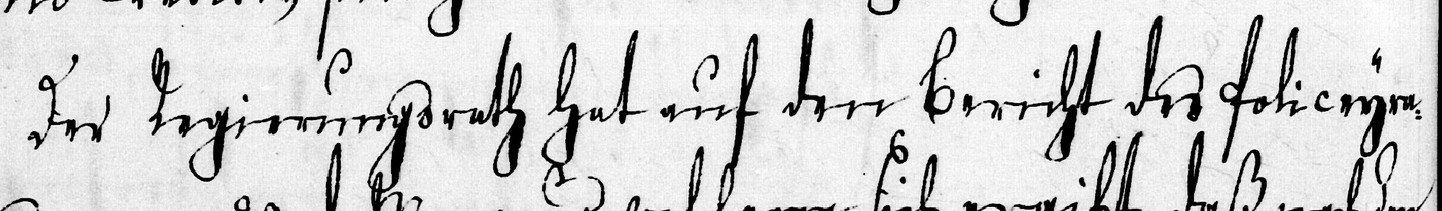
Der Regierungsrath hat auf den Bericht des Policeyr¬
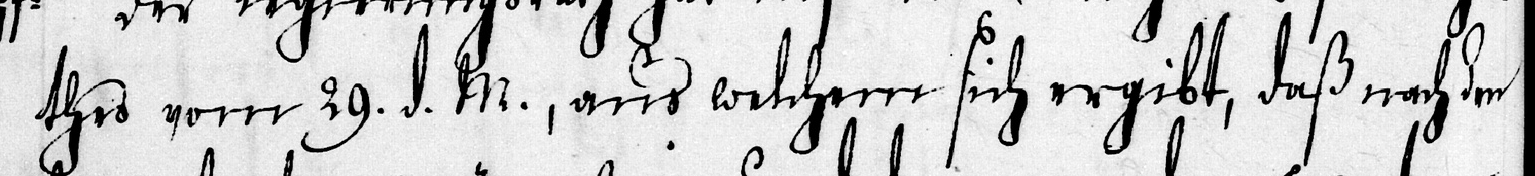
athes vom 29. d. M., aus welchem sich ergibt, daß nach den
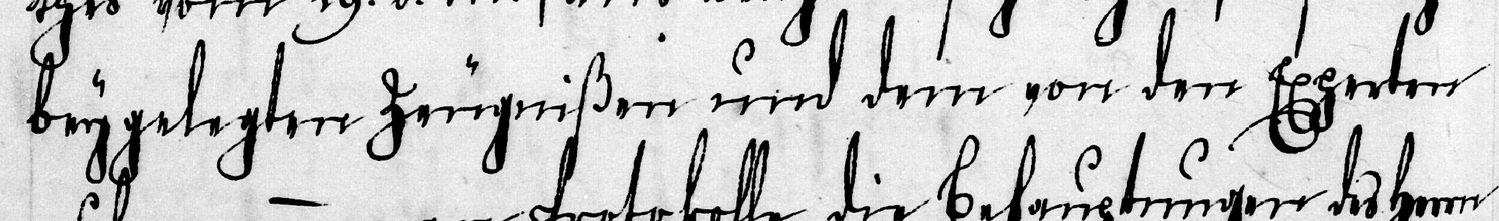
beygelegten Zeugnißen und dem von den Experten
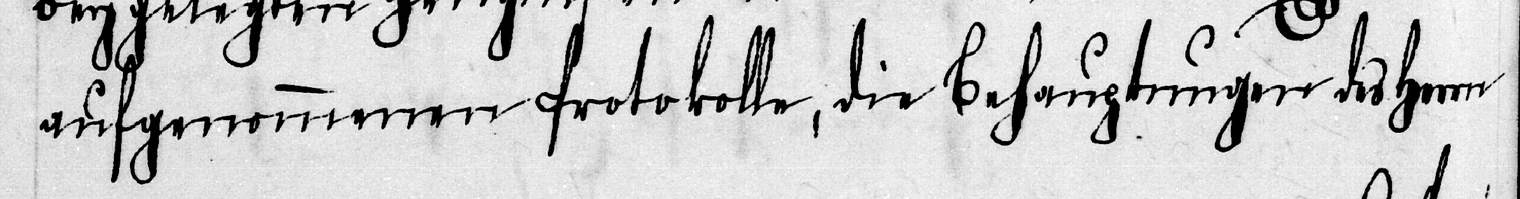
aufgenommenen Protokolle, die Behauptungen des Herrn
